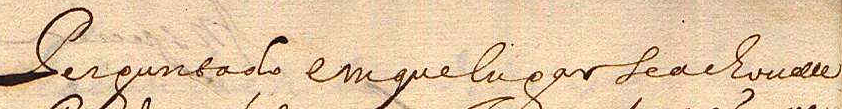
Perguntado em que lugar se achou elle
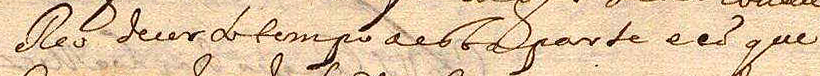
Reo de certo tempo a esta parte e cō que
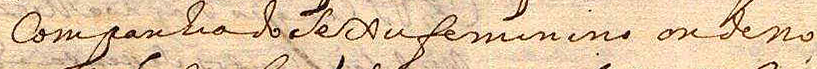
companhia do Sexu feminino onde no
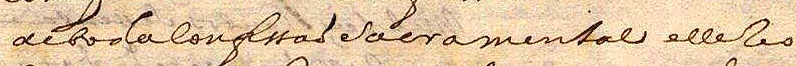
acto da confissaõ sacramental elle Reo
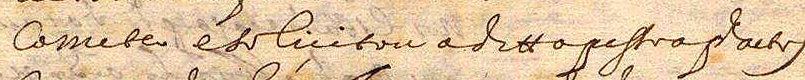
cometeo e solicitou a ditta pessoa pa actos
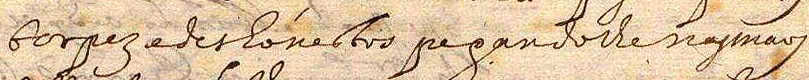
torpez e deshonestos pegandolhe nas maos
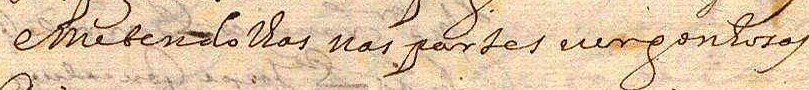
e metendolhas nas partes uergonhosas
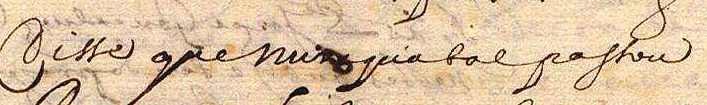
Disse que nunqua tal passou
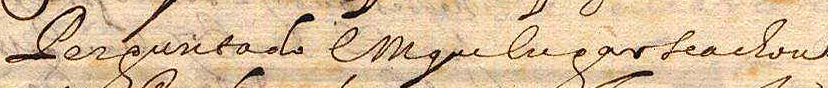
Perguntado em que lugar se achou
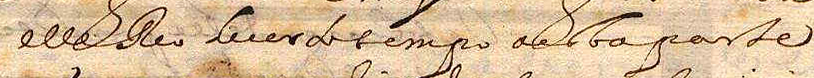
elle Reo de certo tempo a esta parte
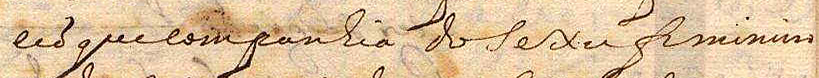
e cō que companhia do sexu feminino
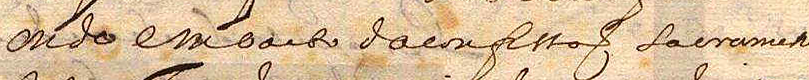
onde em o acto da confissaõ sacramen
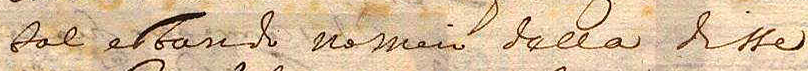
tal estando no meio della disse
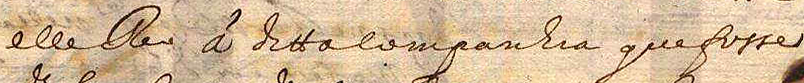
elle Reo á ditta companhia que fosse
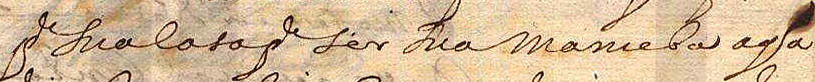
pa sua casa pa ser sua manceba a q̄ a
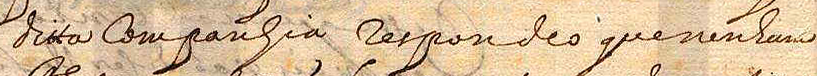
ditta companhia Respondeo que nenhum
